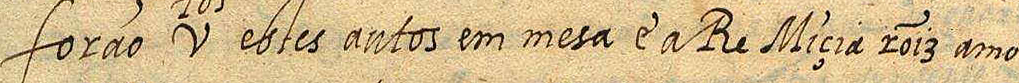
foraõ vtos estes autos em mesa e a Re Miçia rōiz amo
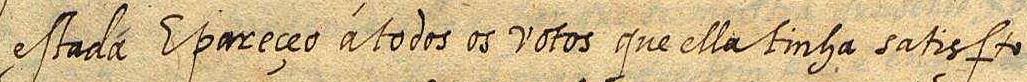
estada E pareçeo a todos os votos que ella tinha satisfto
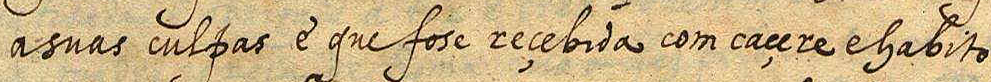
a suas culpas e que fose reçebida com caçere e habito
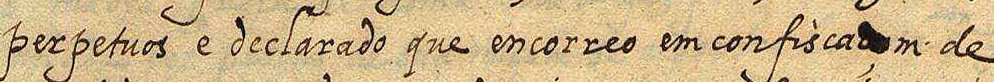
perpetuos e declarado que encorreo em confiscaçom de
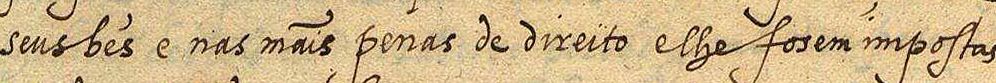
seus bēs e nas māis penas de direito e lhe fosem impostas
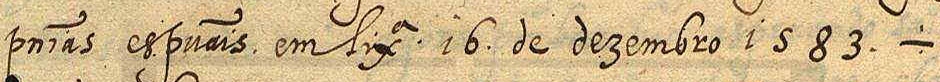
pniās espuaīs. em lixa. i6. de dezembro i583.
